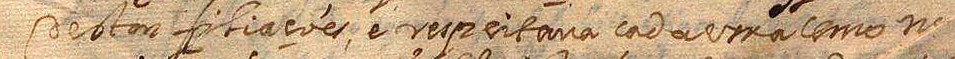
destas filiaçoẽs, e respeitaua cada vma como n
